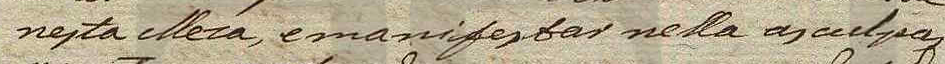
nesta Meza, e manifestar nella as culpas
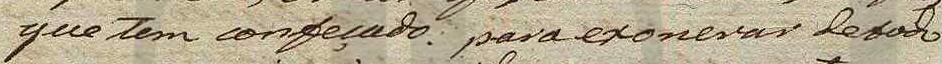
que tem confeçado. para exonerar de todo
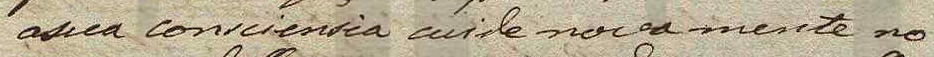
a sua consciencia cuide novamente no
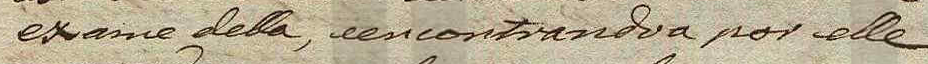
exame della, e encontrandoa por elle
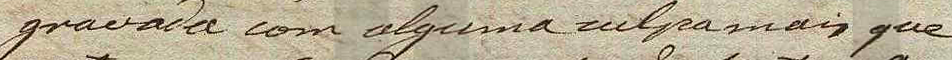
gravada com alguma culpa mais que
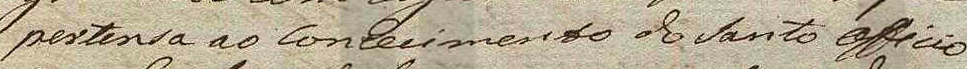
pertensa ao conhecimento do santo officio
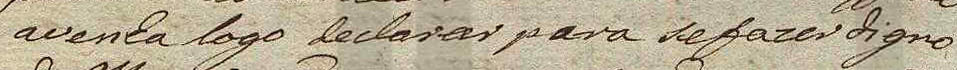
a venha logo declarar para se fazer digno
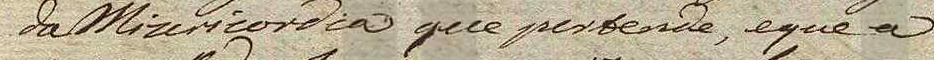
da Mizericordia que pertende, e que a
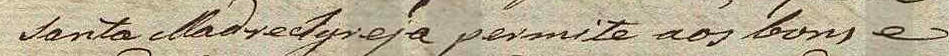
santa Madre Igreja permite aos bons e
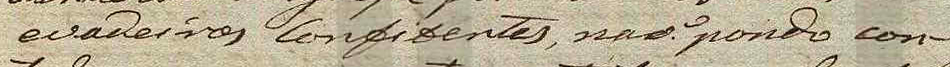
e vadeiros confitentes, naõ pondo con
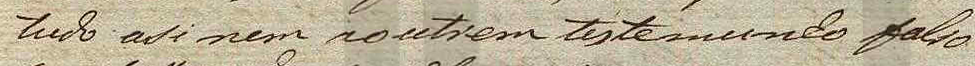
tudo a si nem a outrem testemunho falso
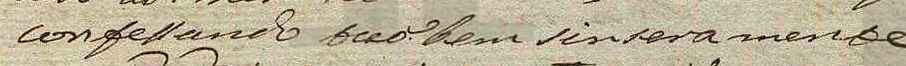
confessando taõbem sinseramente
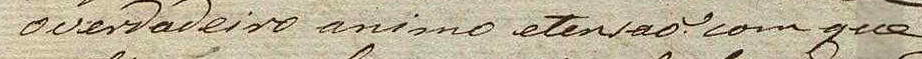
o verdadeiro animo e tensaõ com que
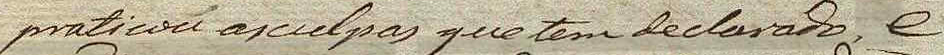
praticou as culpas que tem declarado, e
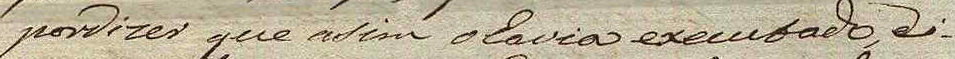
por dizer que asim o havia executado di
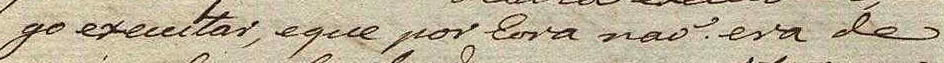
go executar, e que por hora naõ era de
